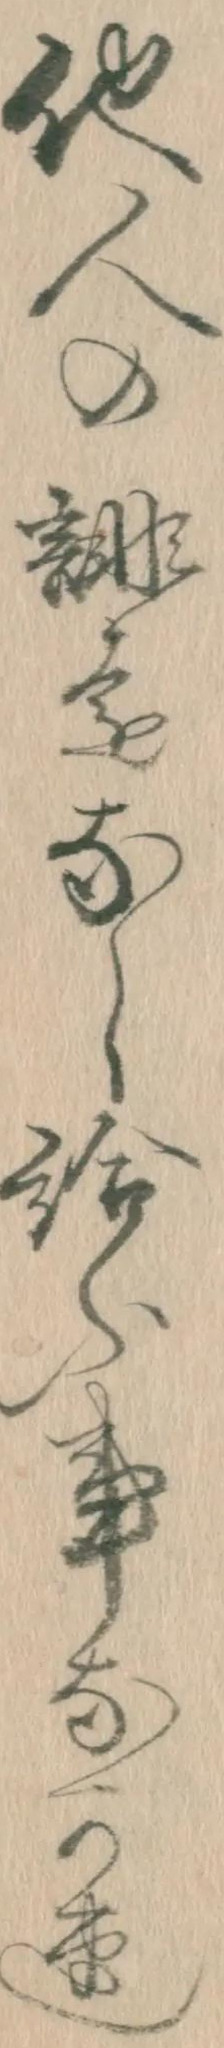他人の誹をなし給ふ事なかれ
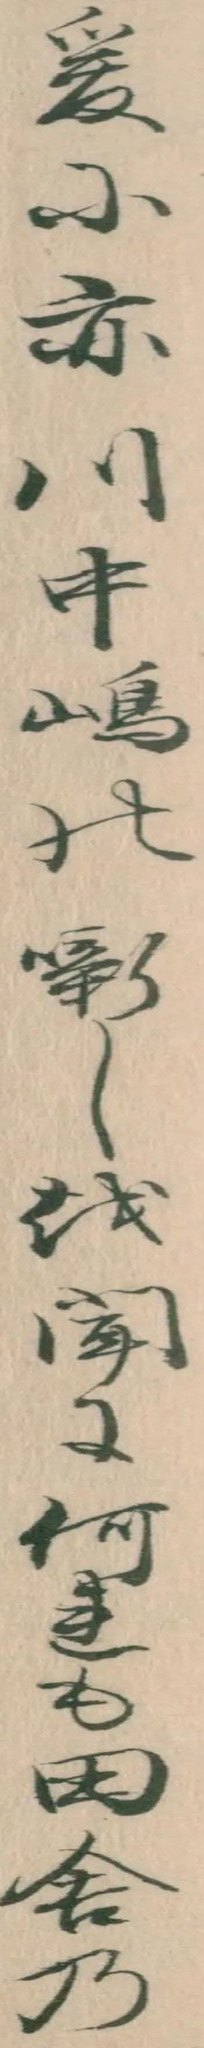爰に亦川中嶋の噺しを聞に何れも田舎の
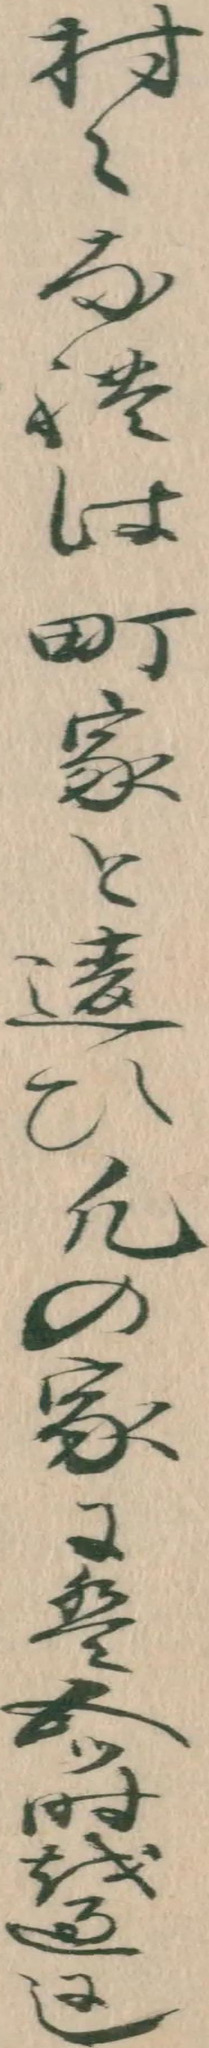村〻なれは町家と違ひ凡の家には五ツ時を過にし
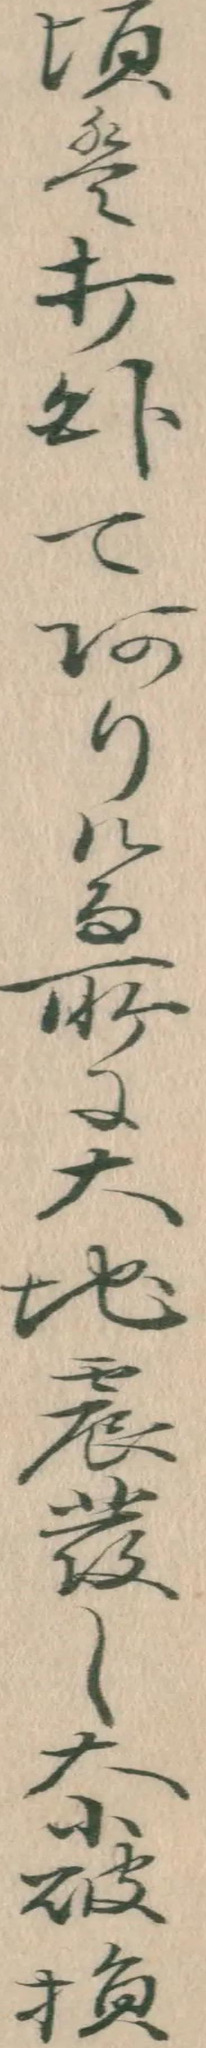頃は打臥てありける所に大地震発し大に破損
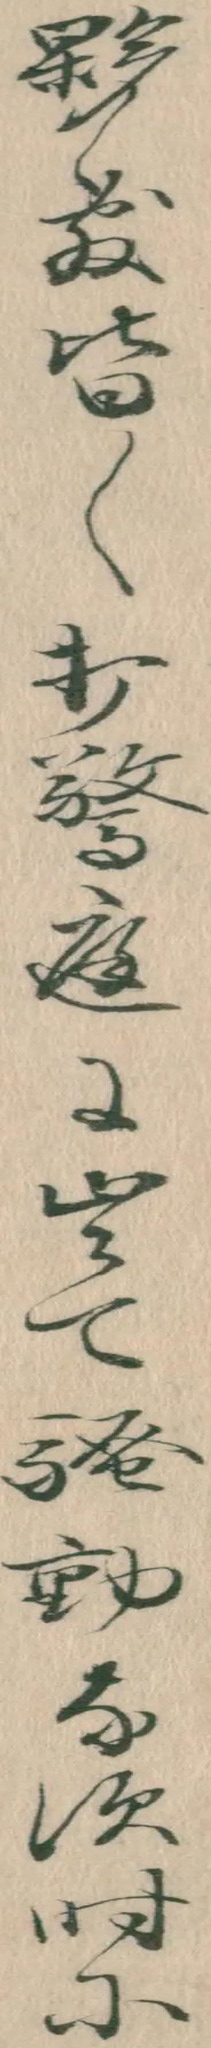夥敷皆〳〵打驚庭に出て騒動なす時に
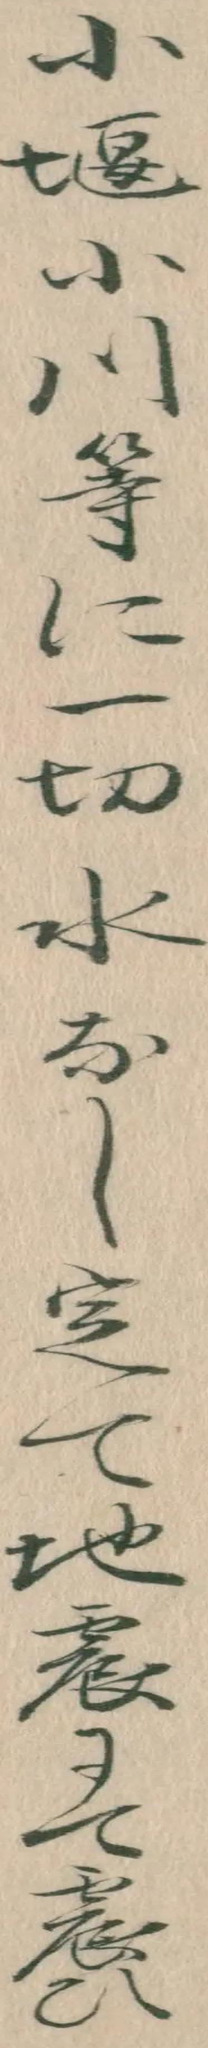小堰小川等に一切水なし定て地震にて震ひ
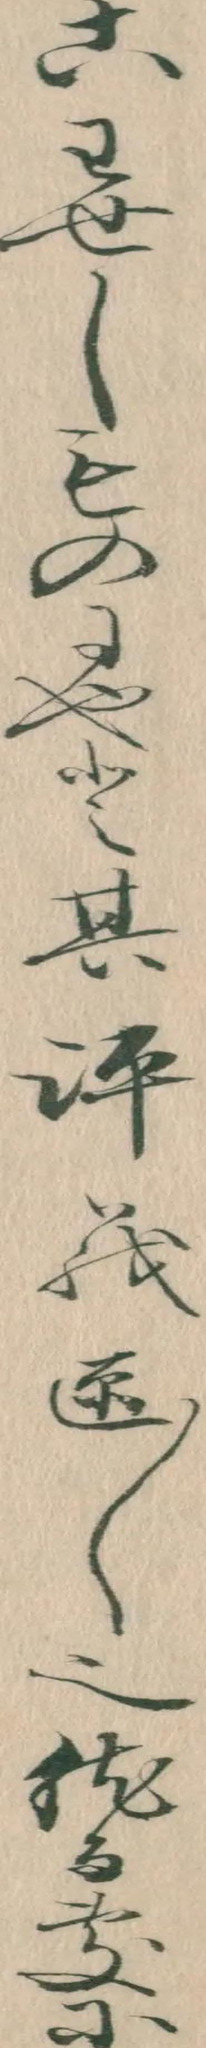こわせしものにやと其評義連〳〵也然る処に
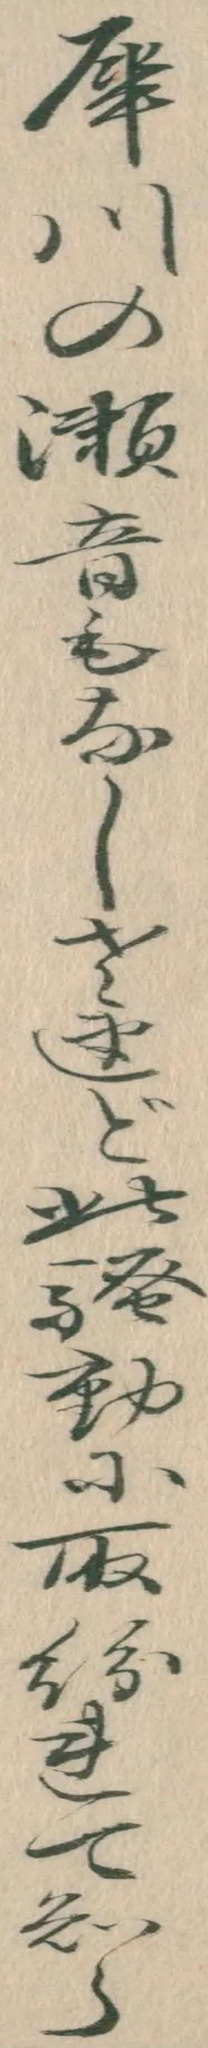犀川の瀬音もなしされど此騒動に取紛て知ら
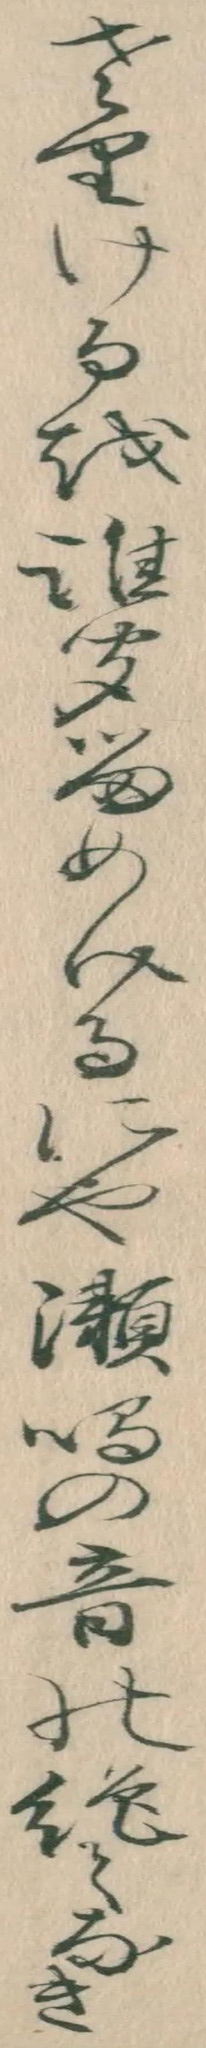さりけるを誰聞留めけるにや瀬鳴の音の絶てなき
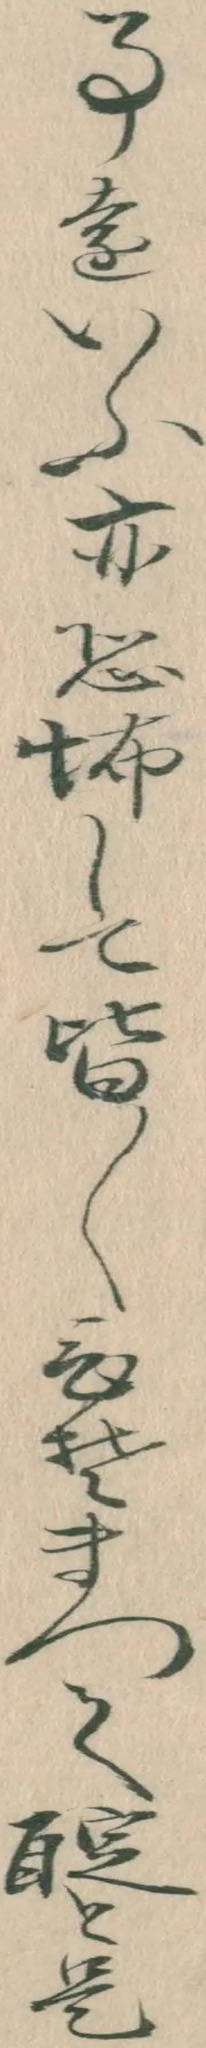事をいふ又恐怖して皆〳〵ひそまつて聢と是
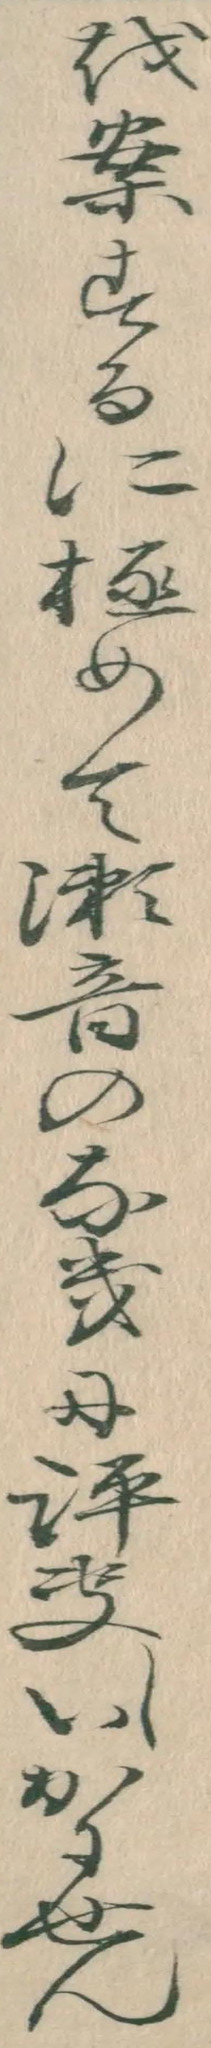を案するに極めて瀬音のなきに評決しいかにせん

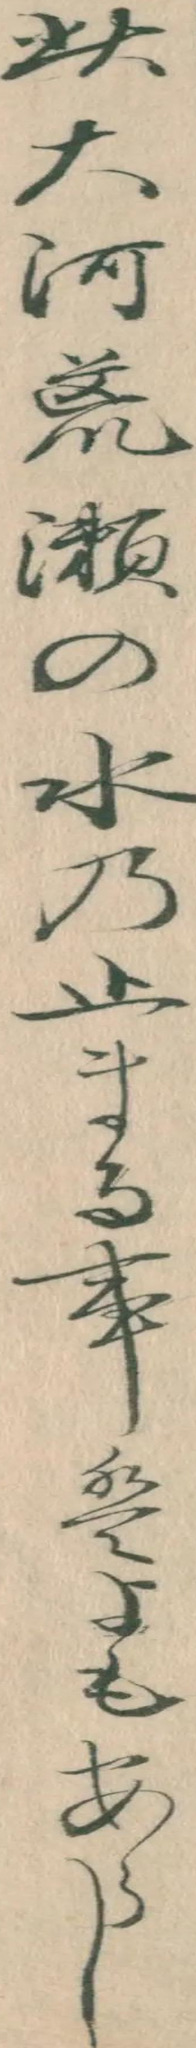此大河荒瀬の水の止まることはよもあらし
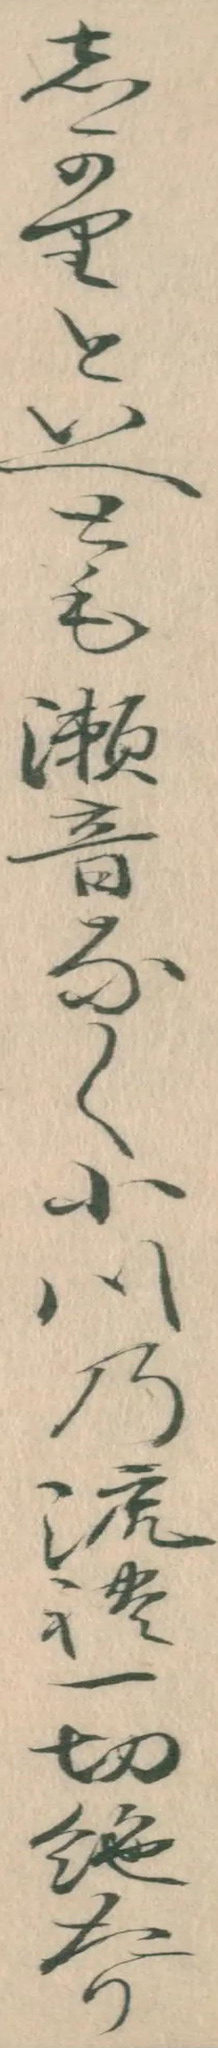しかりといへとも瀬音なく小川の流れ一切絶たり
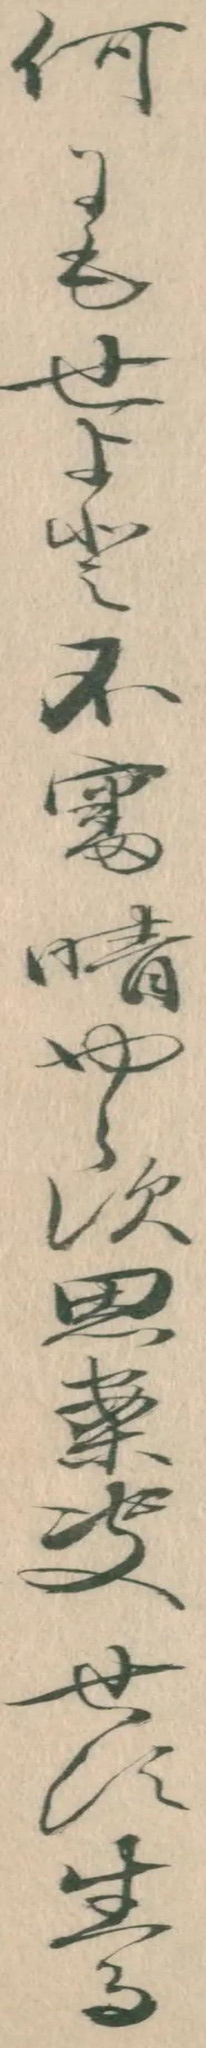何にもせよと不審晴やらす思案決せす生る
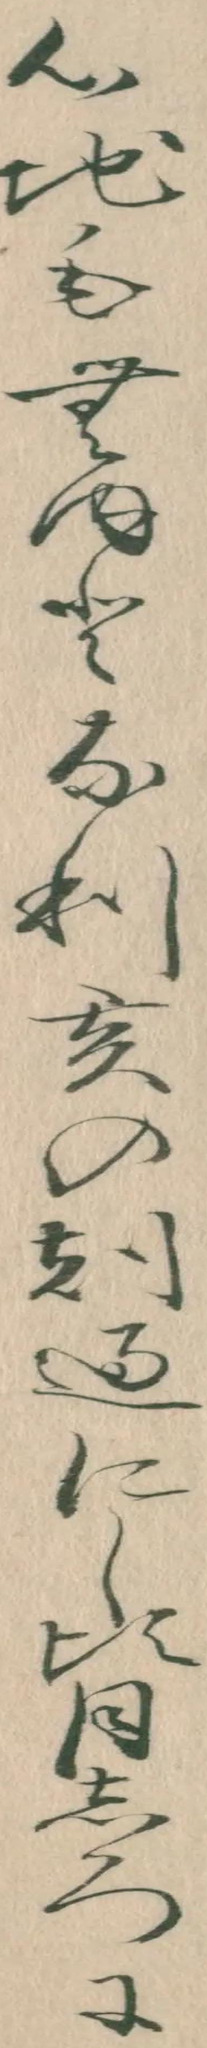心地も無ほとなり亥の刻過にし頃月しろに
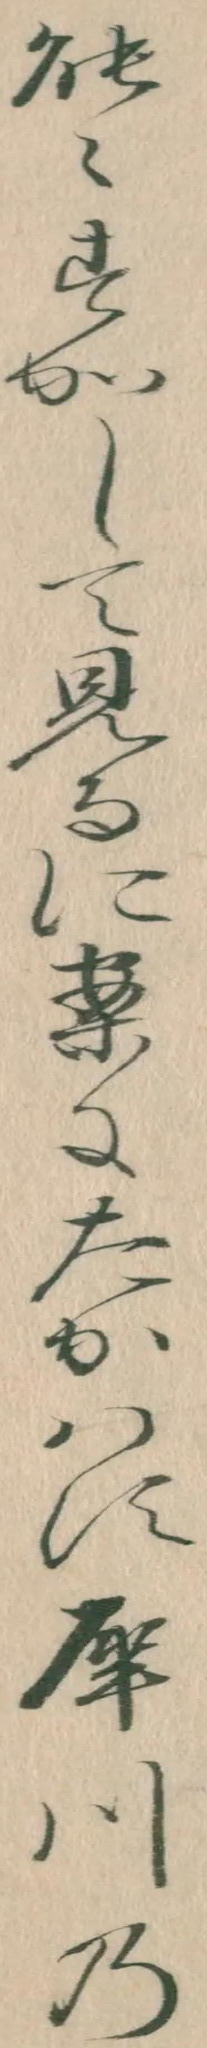能〻すかして見るに案にたかはす犀川の
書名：俗語之種. [6]
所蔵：国立国会図書館 National Diet Library, JAPAN
